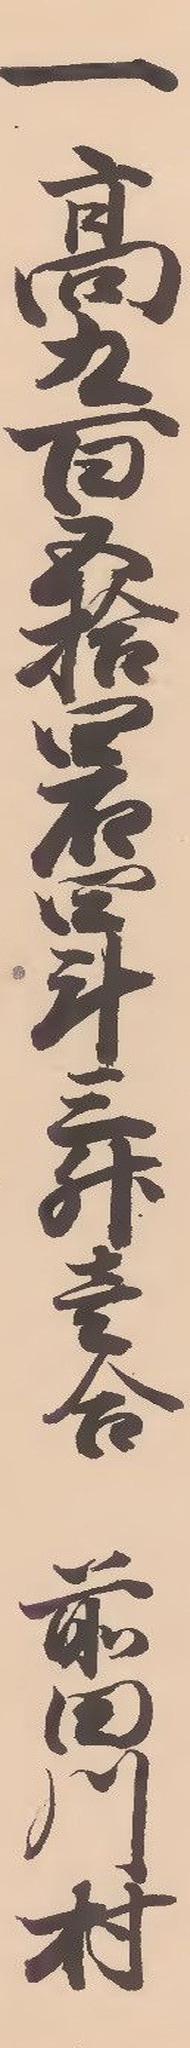一高九百五拾四石四斗三升壱合前田川村

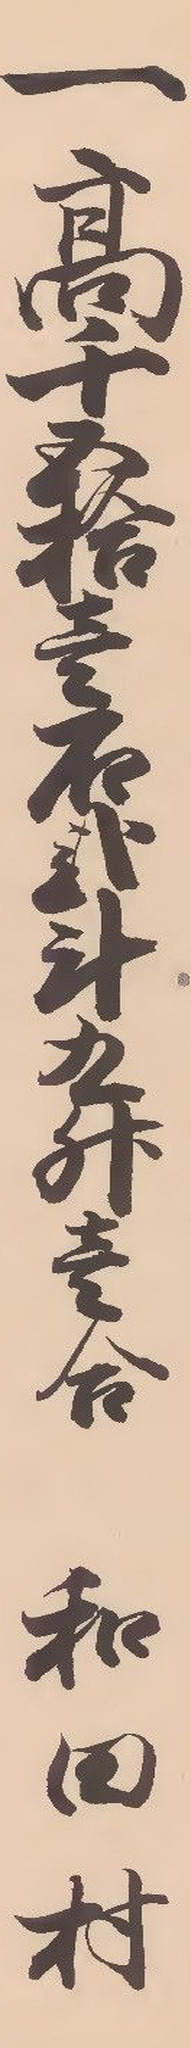一高千五拾壱石弐斗九升壱合和田村
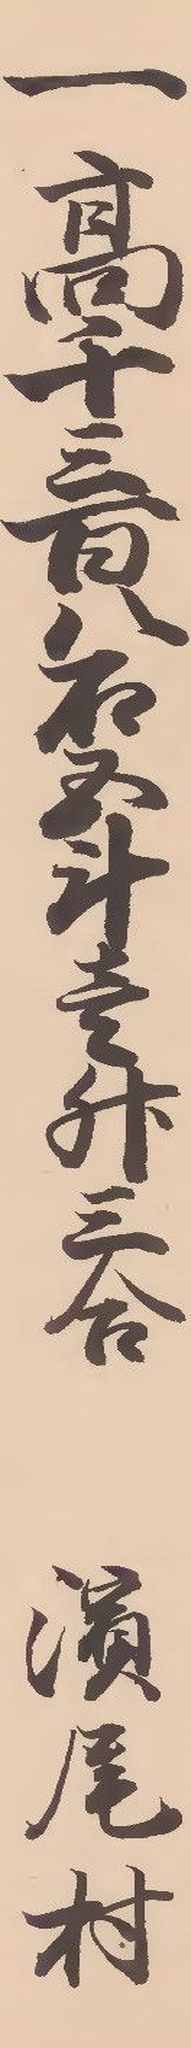一高千三百八石五斗壱升三合浜尾村
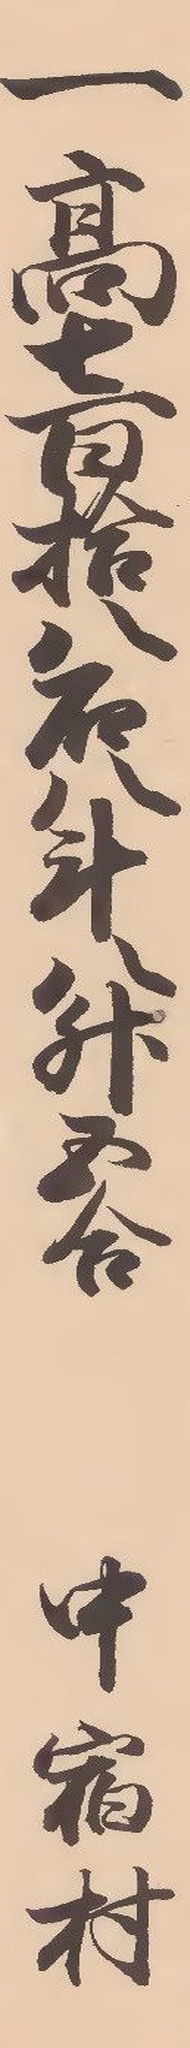一高七百拾八石八斗八升五合中宿村
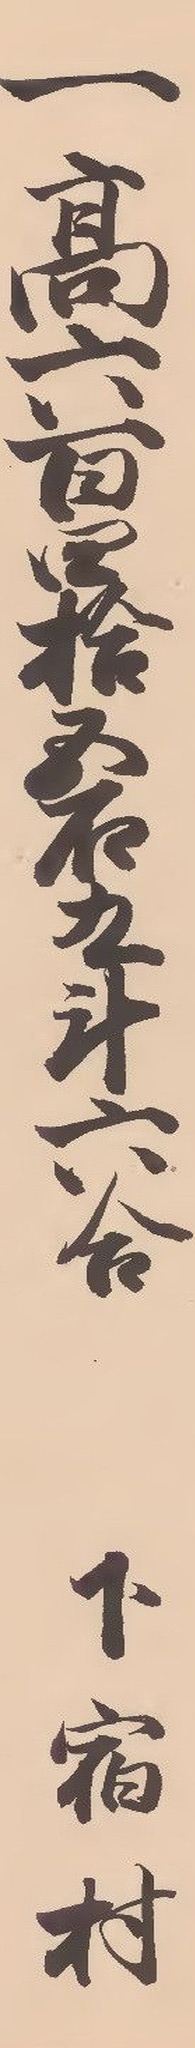一高六百四拾五石九斗六合下宿村
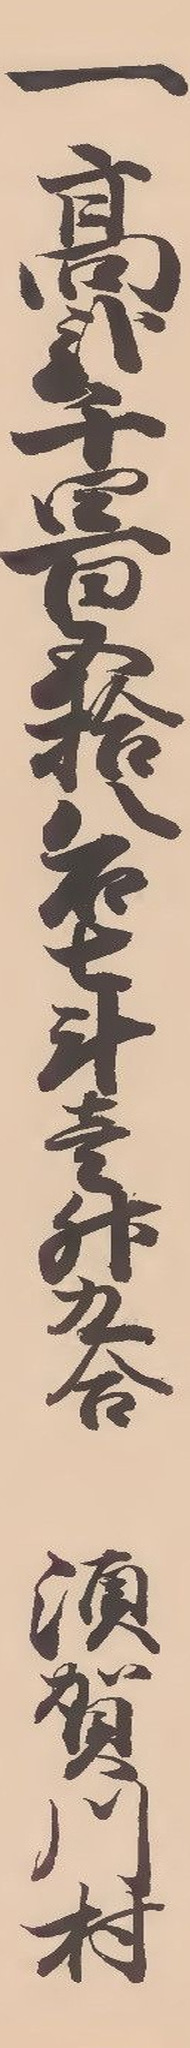一高弐千四百五拾八石七斗壱升九合須賀川村
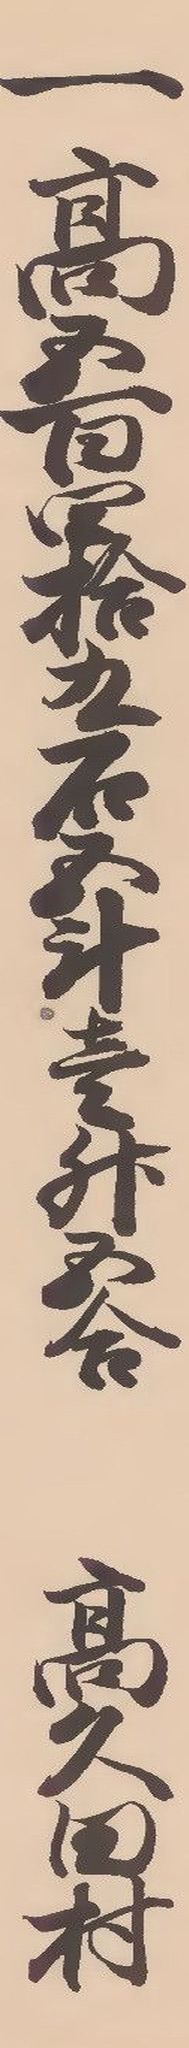一高五百四拾九石五斗壱升五合高久田村
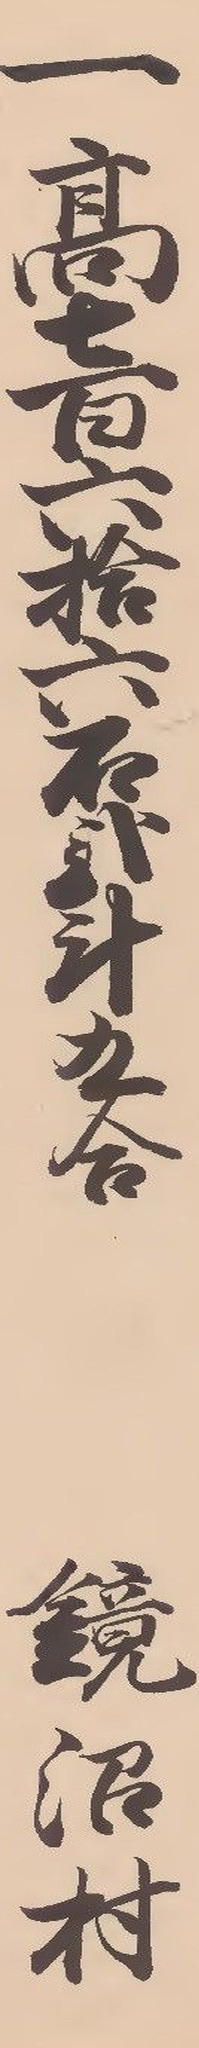一高七百六拾六石弐斗九合鏡沼村

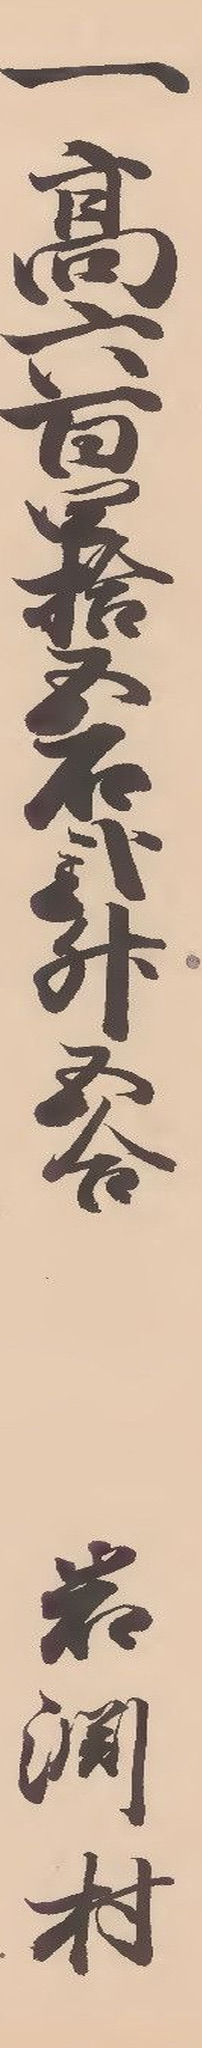一高六百四拾五石弐升五合岩淵村
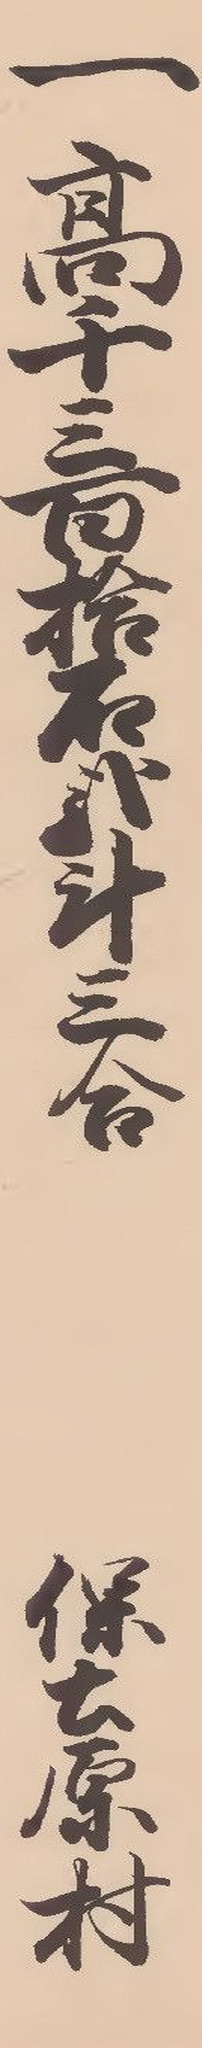一高千三百拾石弐斗三合保土原村
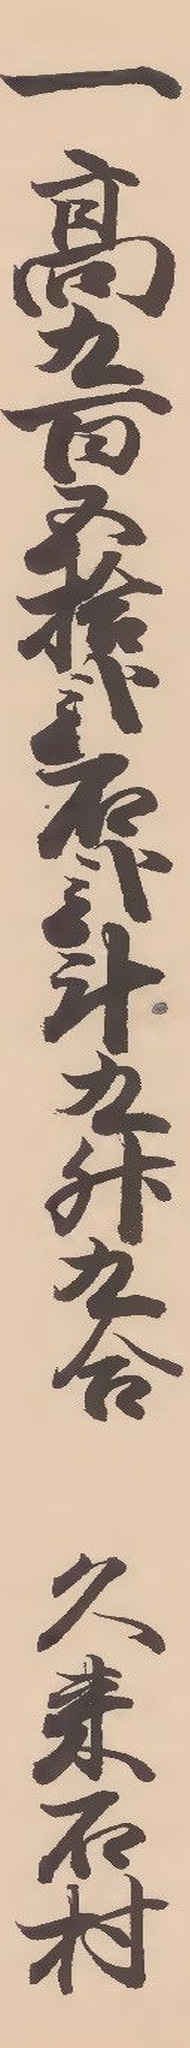一高九百五拾弐石弐斗九升九合久来石村
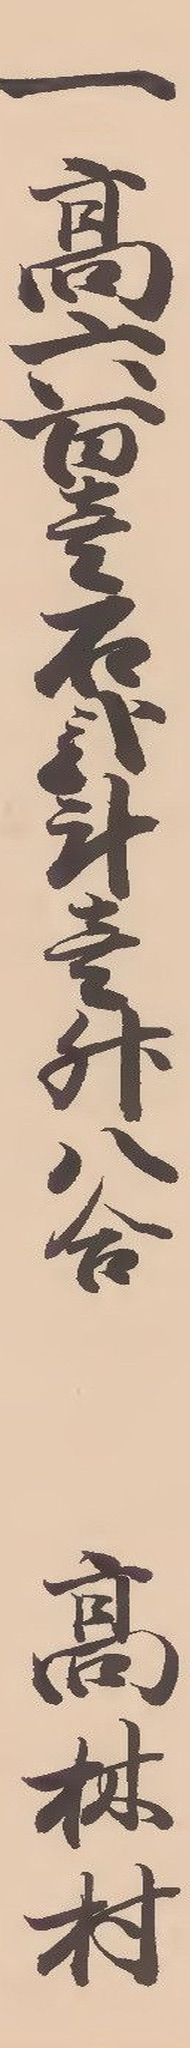一高六百壱石弐斗壱升八合高林村
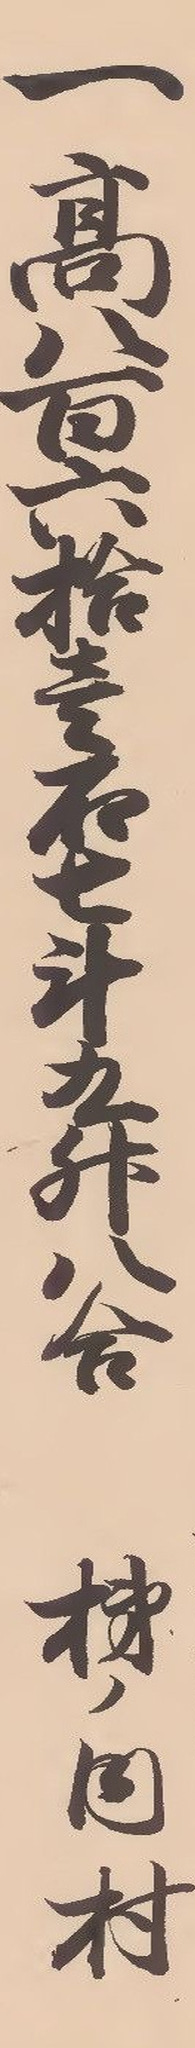一高八百六拾壱石七斗九升八合柿ノ内村
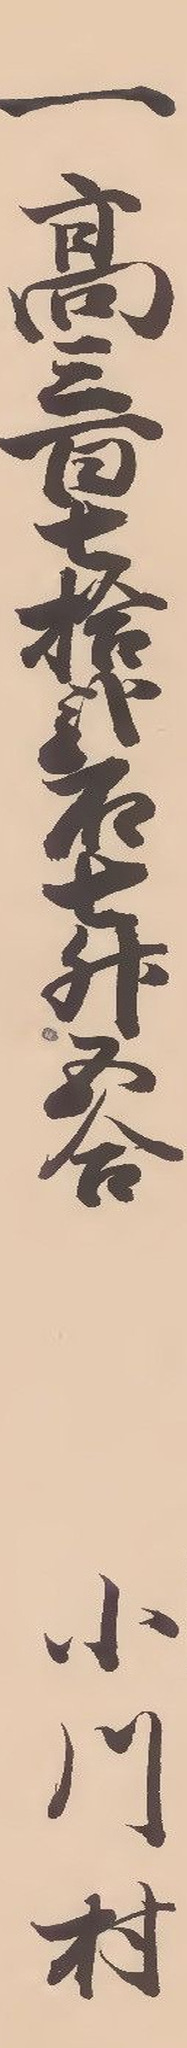一高三百七拾弐石七升五合小川村
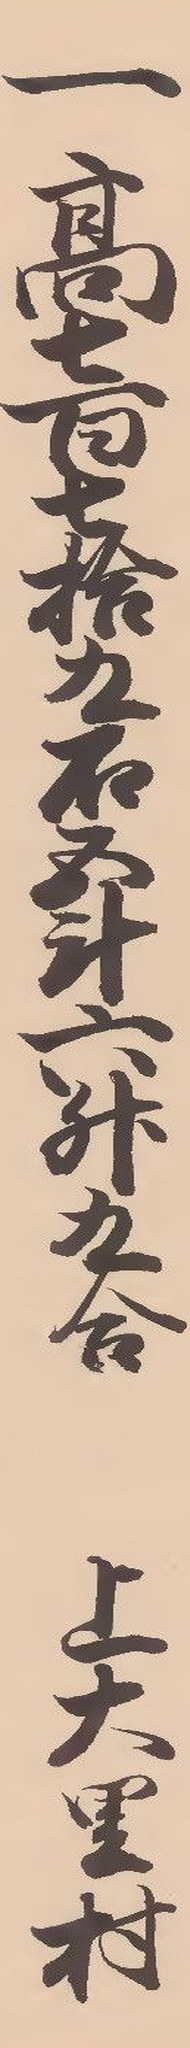一高七百七拾九石五斗六升九合上大里村
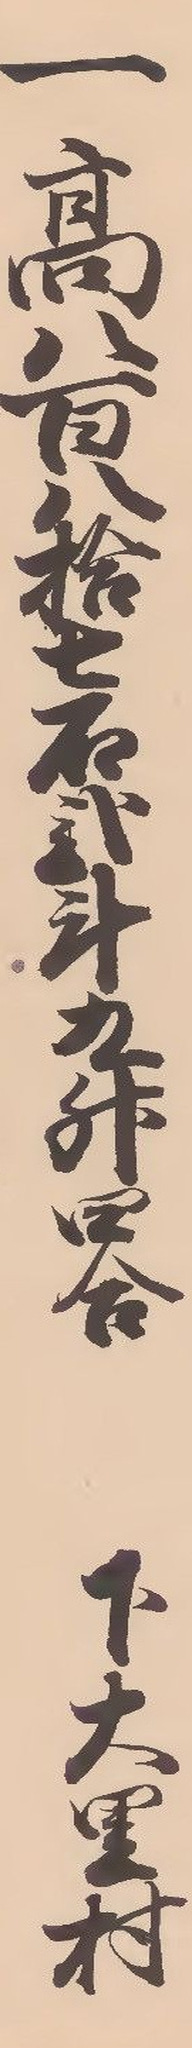一高八百八拾七石弐斗九升四合下大里村
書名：陸奥国郷帳　２
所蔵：国立公文書館 National Archives of Japan
